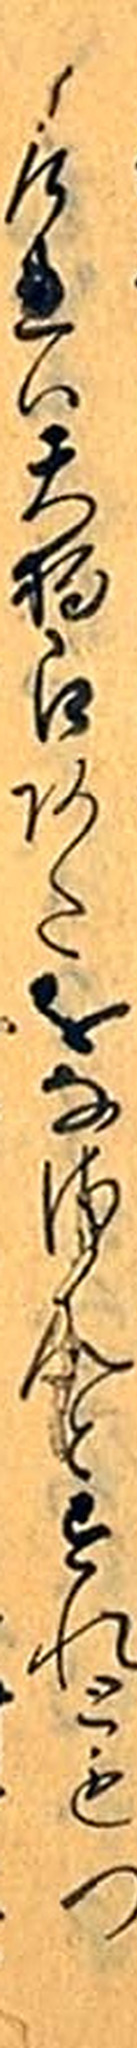けれは天狗即あたをなさんとすれともつ
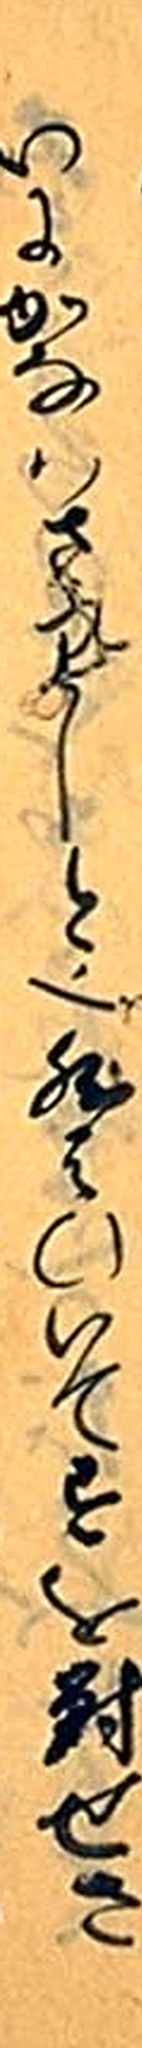いにかなはさりしと也然はひいてすを対せさ
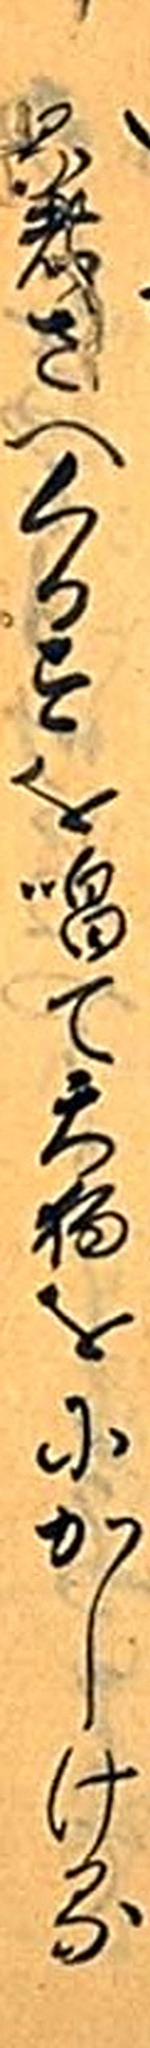る者さへくるすを唱て天狗をにかしける
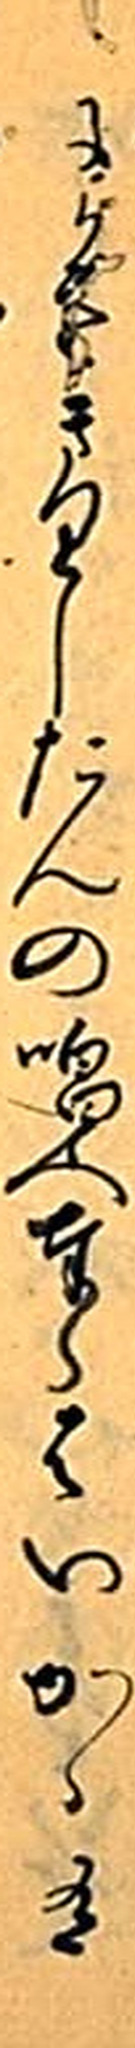によききりしたんの唱へ奉らはいかゝ有
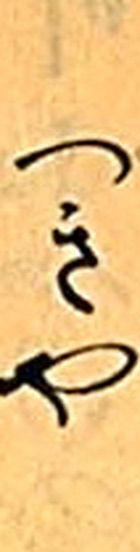へきや
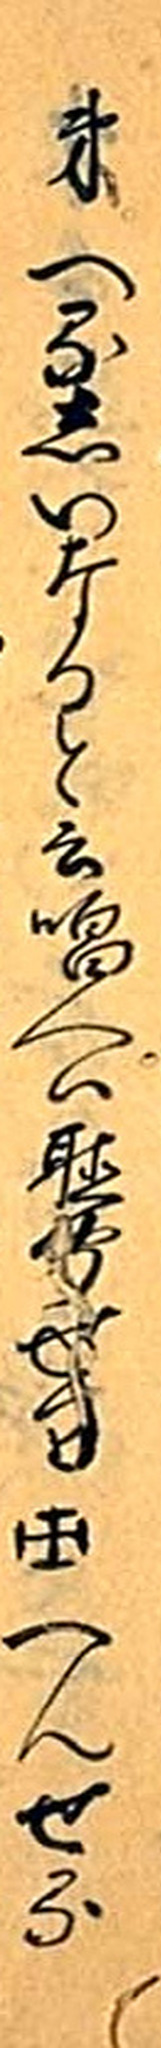弟へるしいなると云唱へは聴聞せ☩へんせる
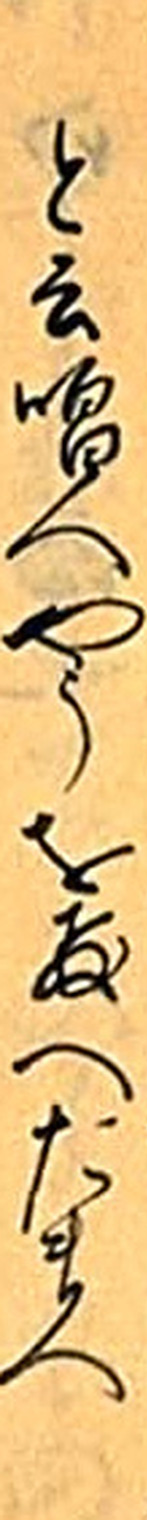と云唱へやうを教へたまへ
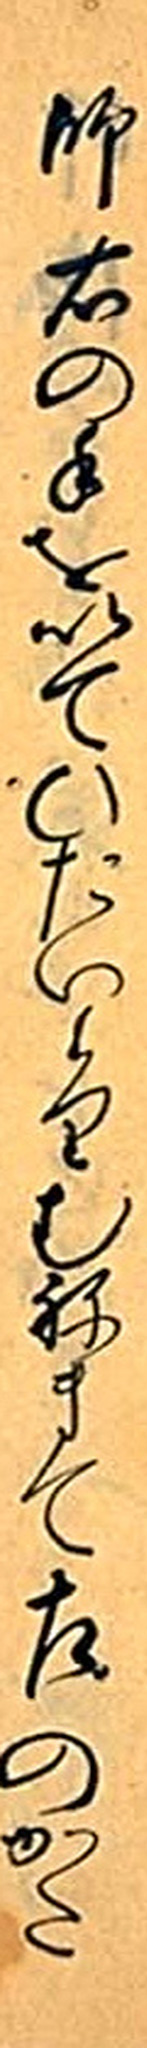師右の手を以てひたいよりむねまて左のかた
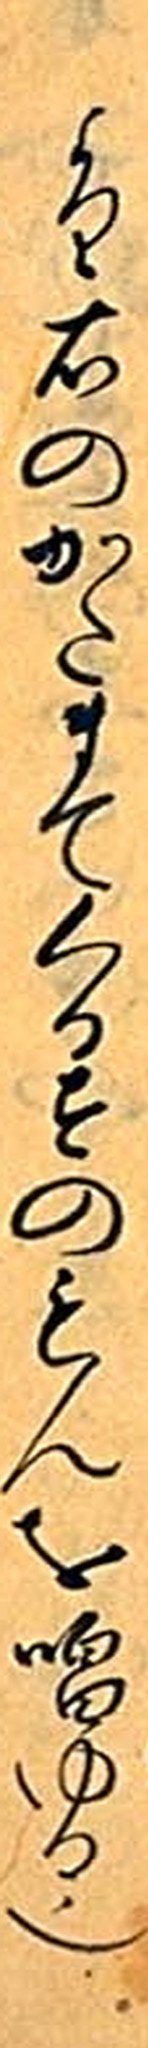より右のかたまてくるすのもんを唱ゆる也
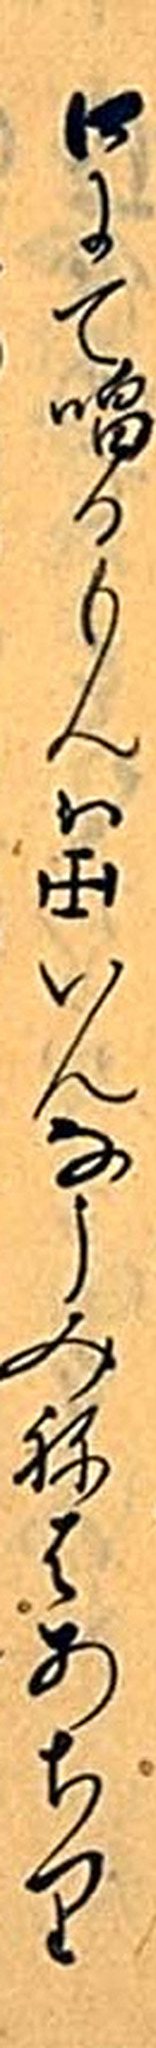口にて唱るもんは☩いんなうみねはあちり
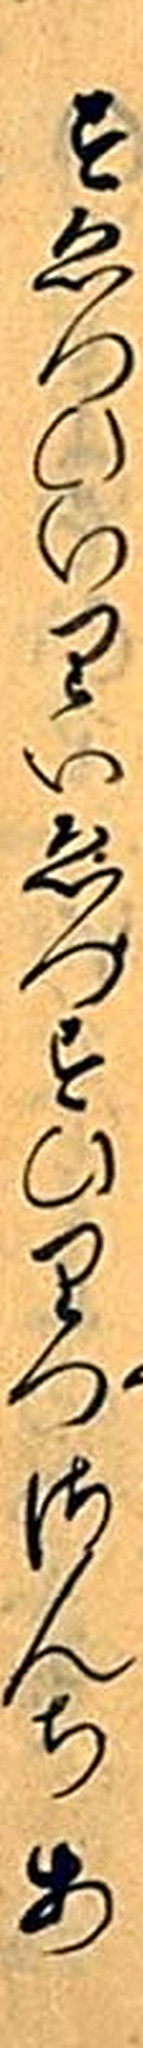すゑつひいりいゑつすひりつさんちあ
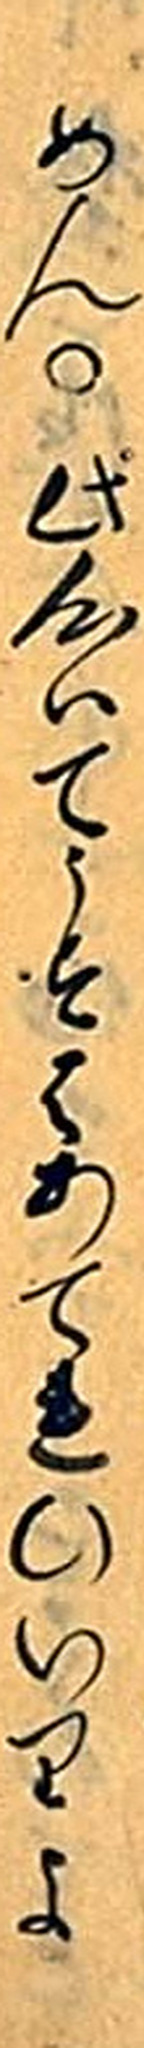めん○此心はてうすはあてれひいりよ
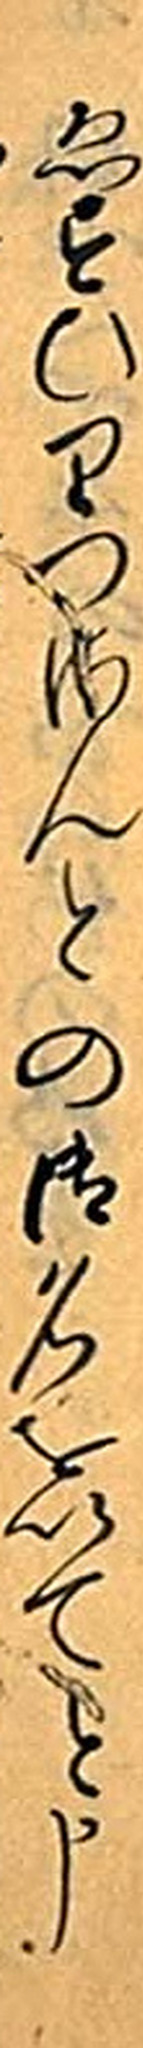ゑすひりつさんとの御名を以てと申
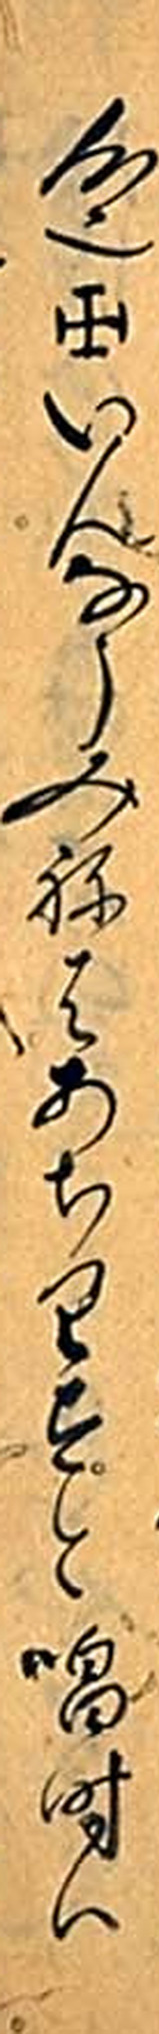心也☩いんなうみねはあちりすと唱時は
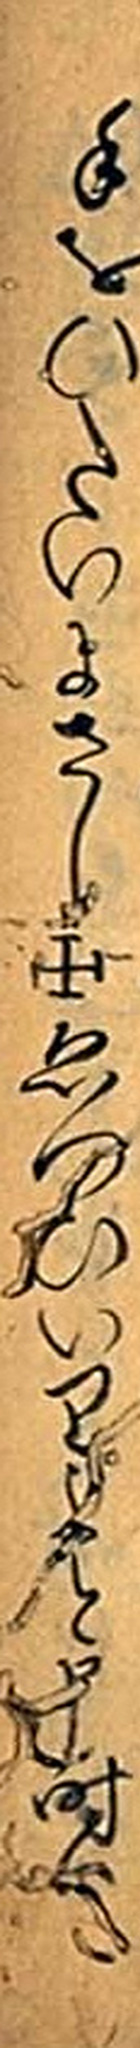手をひたいにさし☩ゑつひいりと申時は

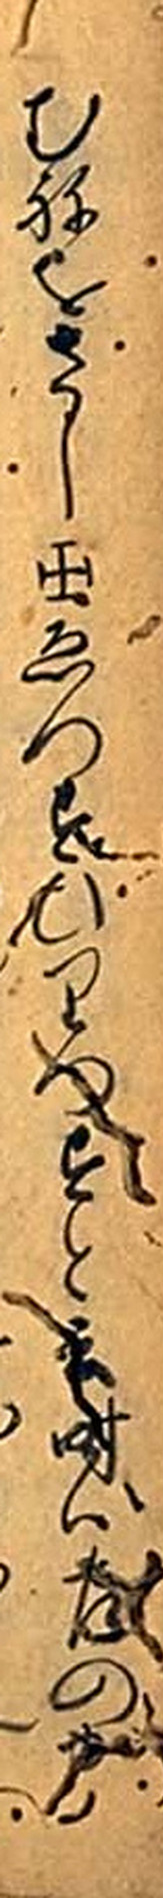むねをさし☩ゑつすひりつすと云時は左のか
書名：ドチリナ・キリシタン
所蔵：東京大学総合図書館 / General Library in the University of Tokyo
